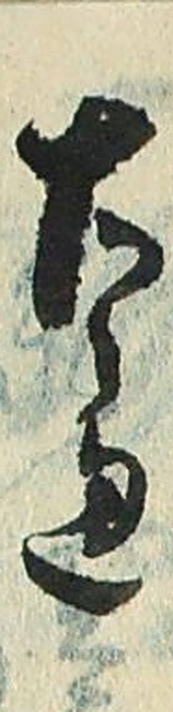右之通
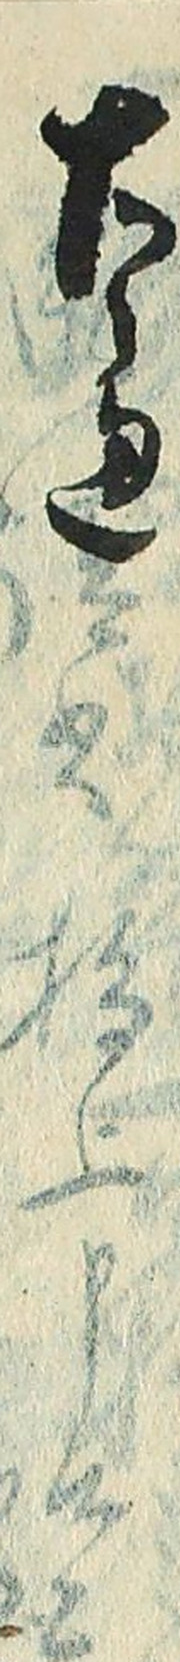右之通
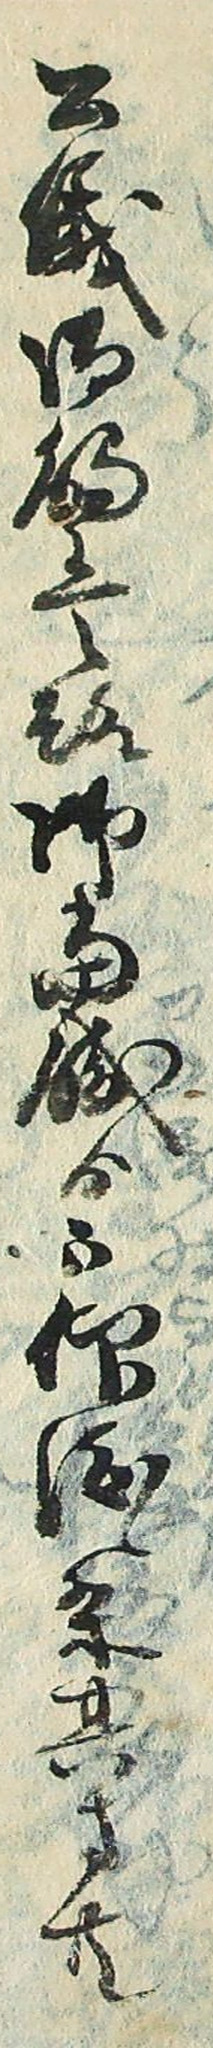公義御触有之趣御当職ゟ被仰渡候条其方共
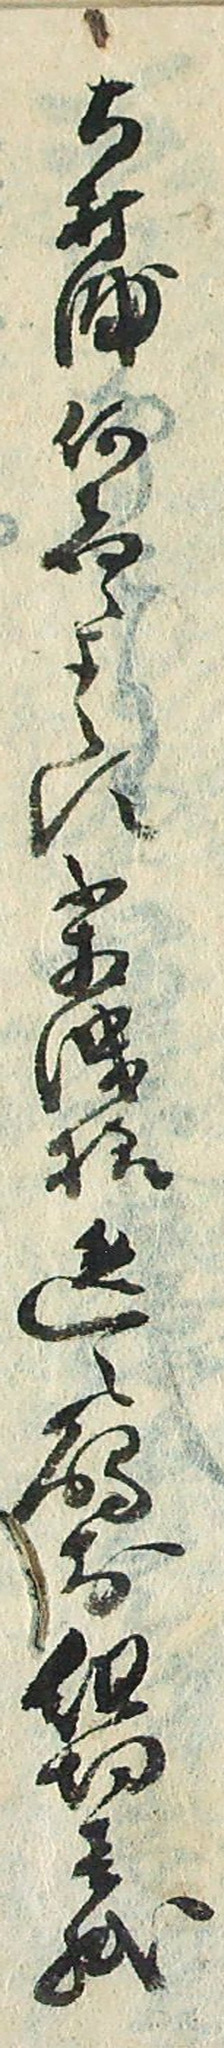与村浦何者によらす不相洩様逸々触知組切壱紙
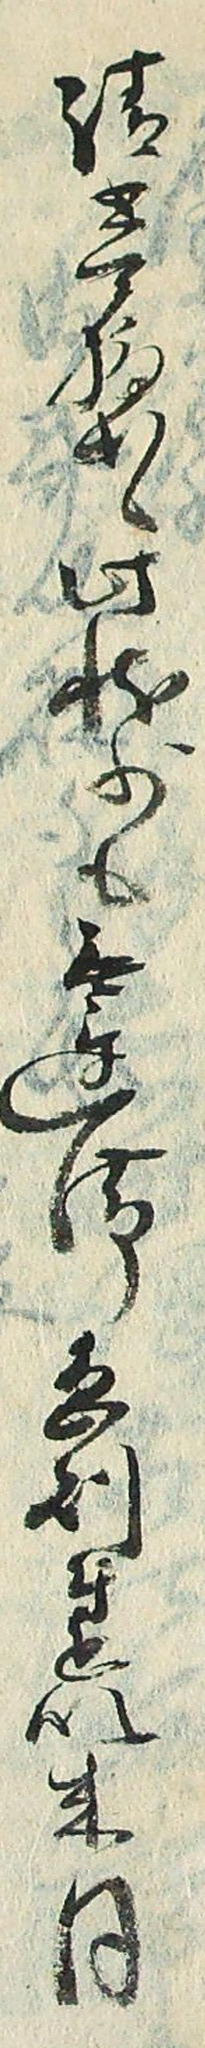請書可指出候此状少も無遅滞急刻付を以来月

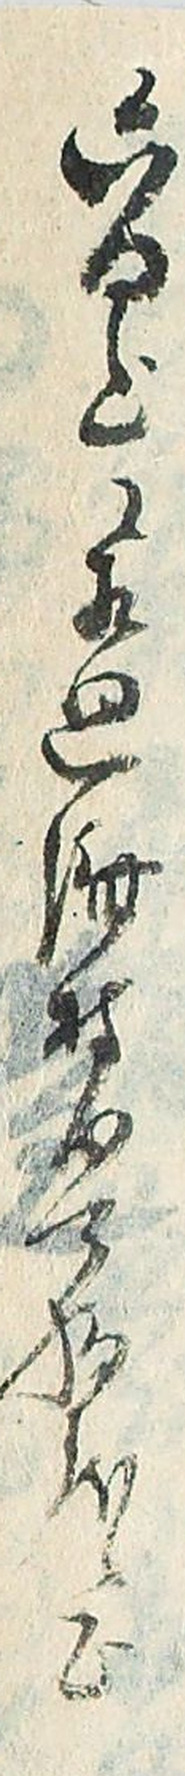六日迄に相廻済村ゟ可指戻候以上
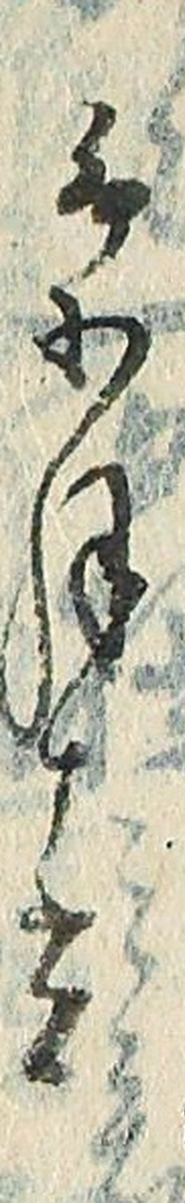卯五月十五日
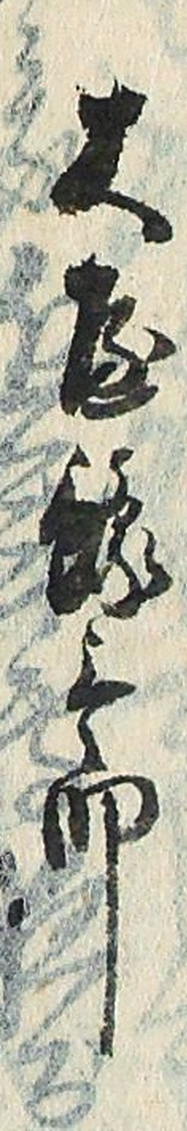大屋予三郎
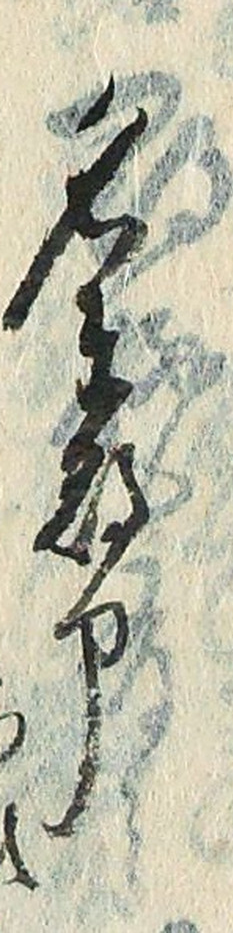名東郡中
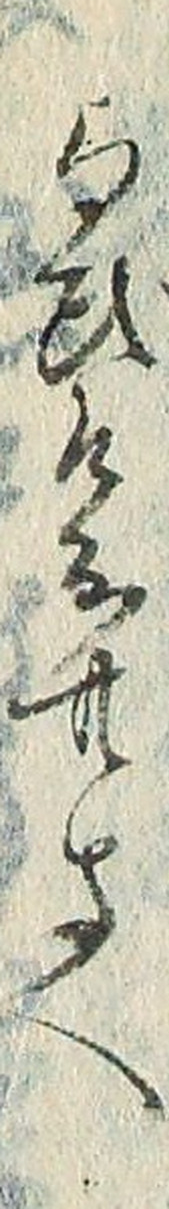与頭庄屋共方へ
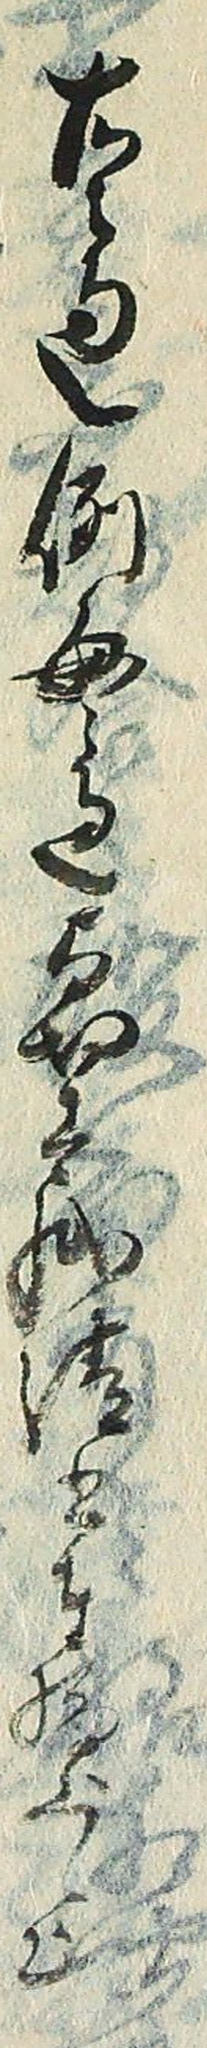右之通例毎之通与切壱紙請書奉指上候以上
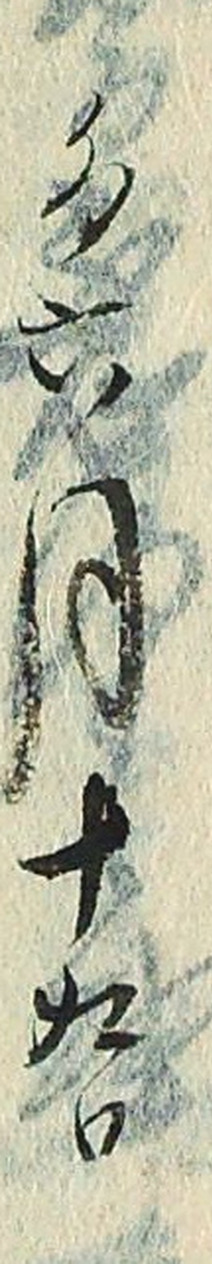卯六月十九日
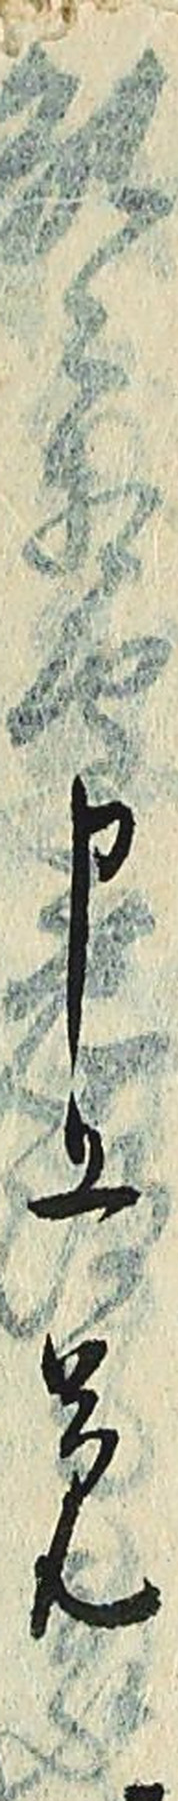申上覚
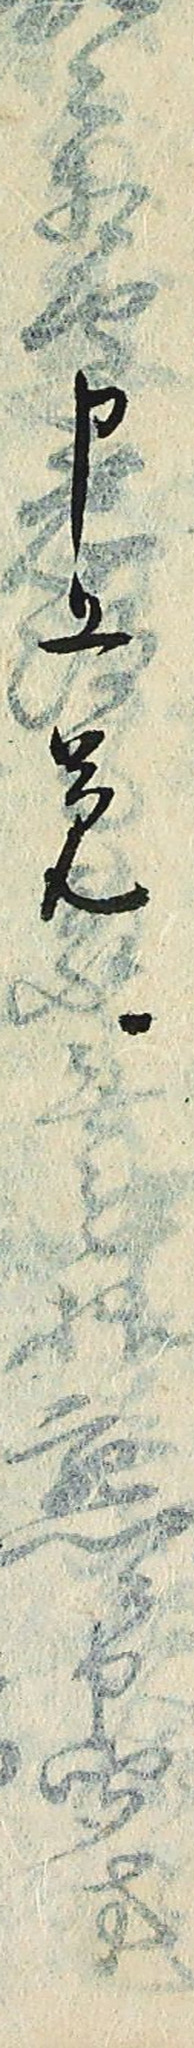申上覚
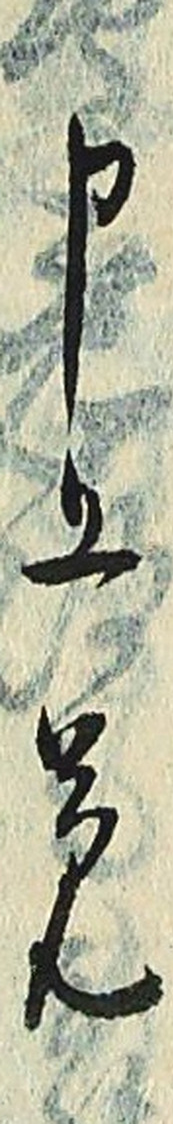申上覚
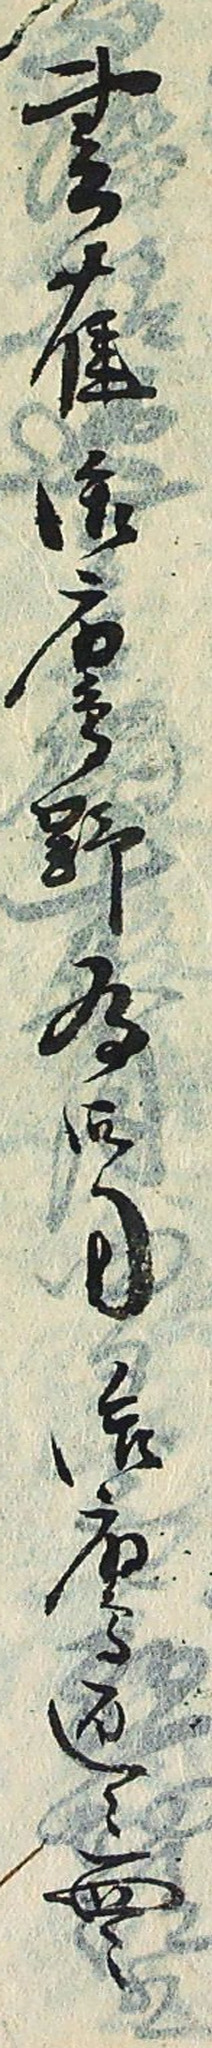雲雀御鷹野為御用御鷹匠之面々
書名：諸御用御□受書控
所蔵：鳴門教育大学 Naruto University of Education
